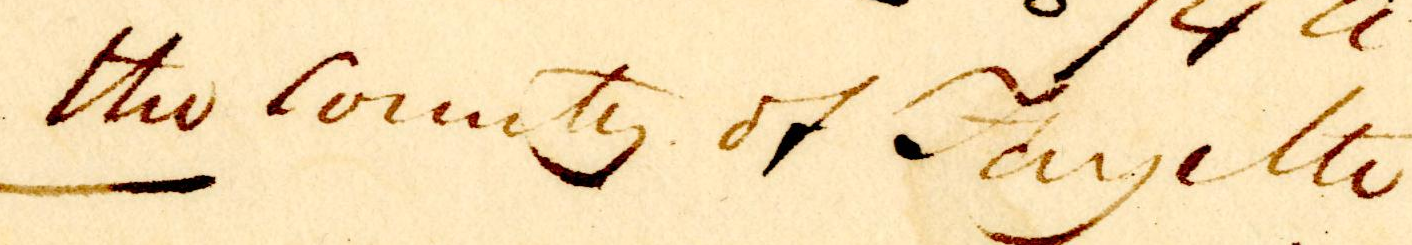the county of Fayette
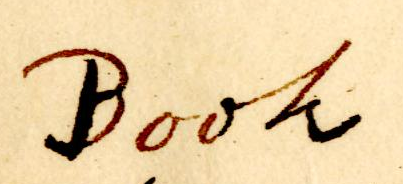Book
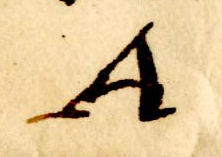A
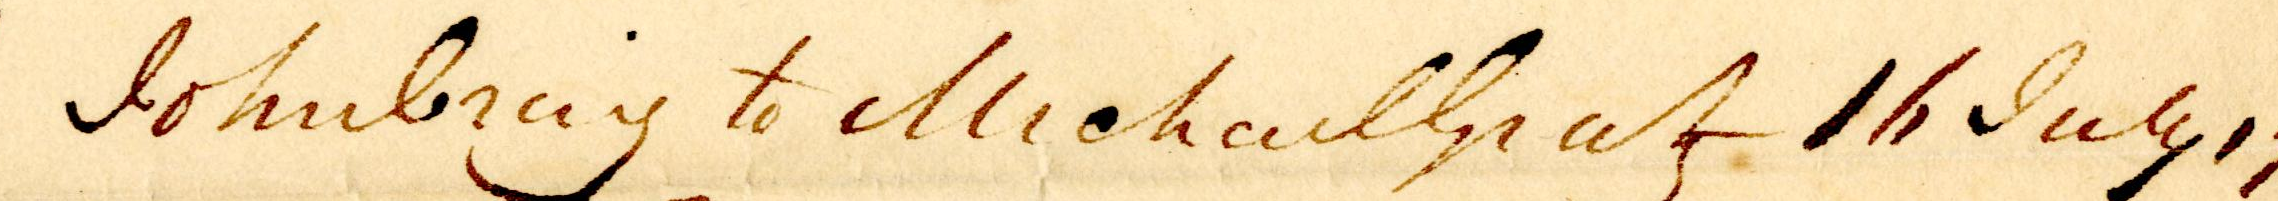John Craig to Michael Graz 16 July 1784
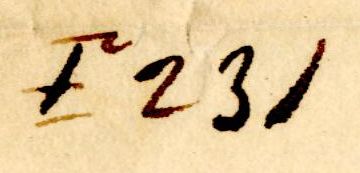E 231
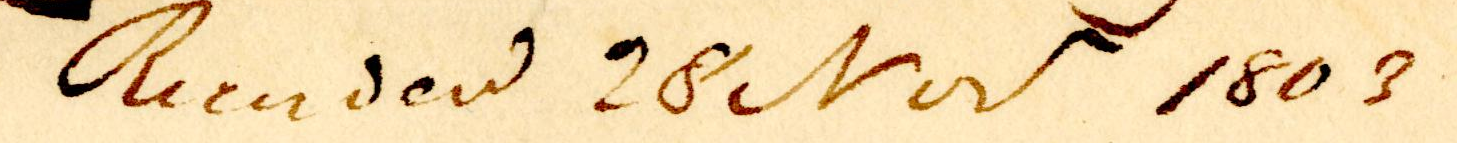Received 28 Nov 1803
